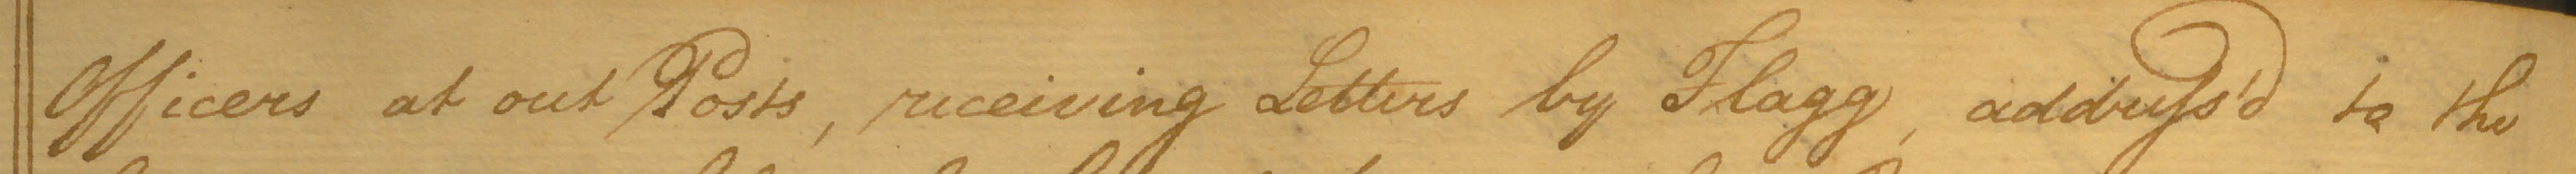Officers at out Posts, receiving Letters by Flagg, address'd to the
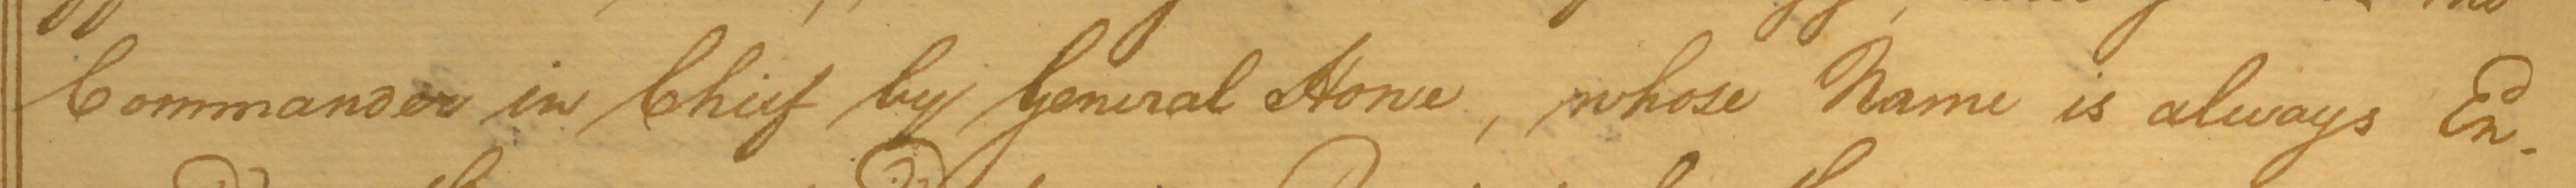Commander in Chief by General Stone, whose Name is always En
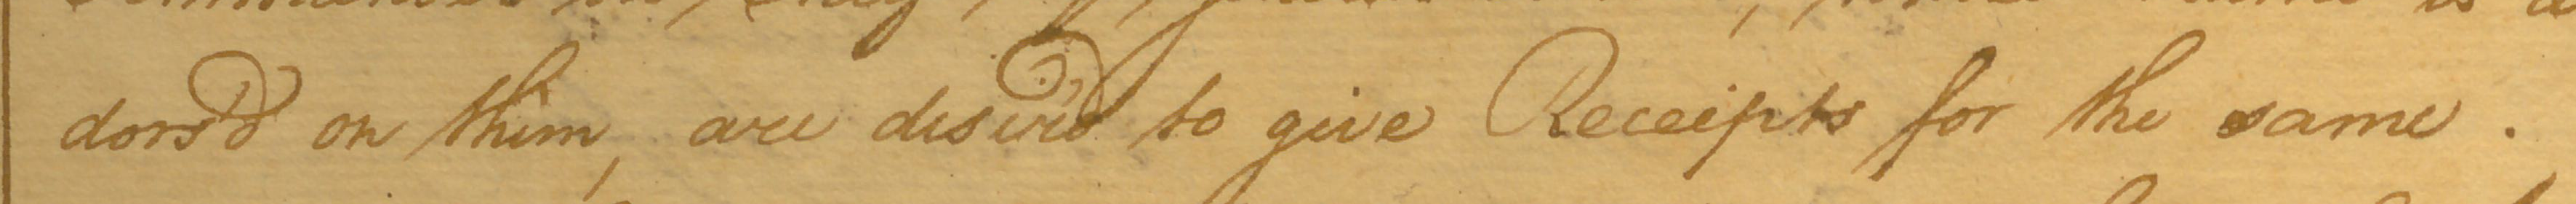dors'd on them, are desir'd to give Receipts for the same.
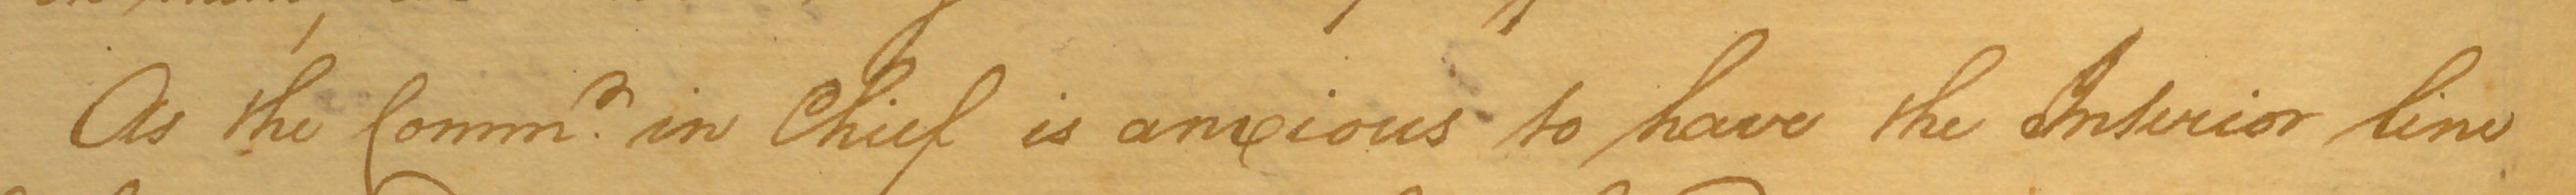As the Comm^r. in Chief is anxious to have the Interior line
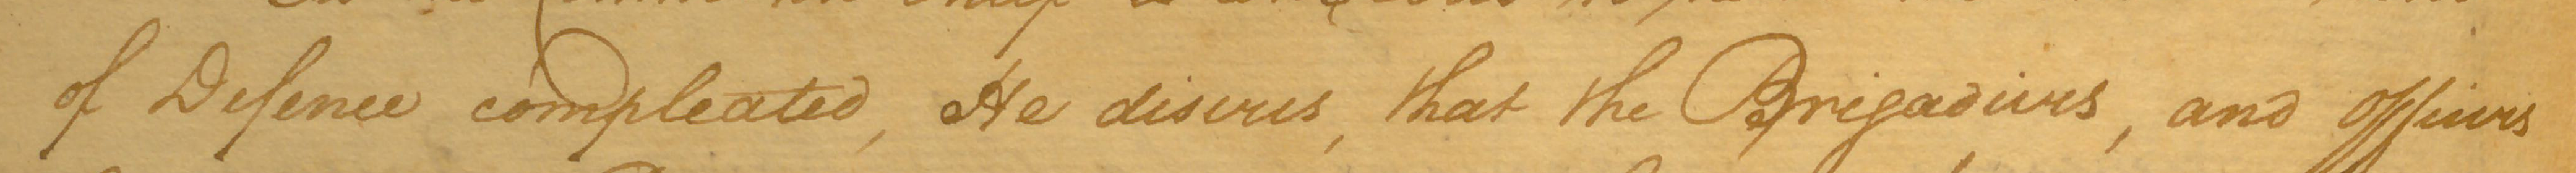of Defence compleated, He desires that the Brigadiers, and officers
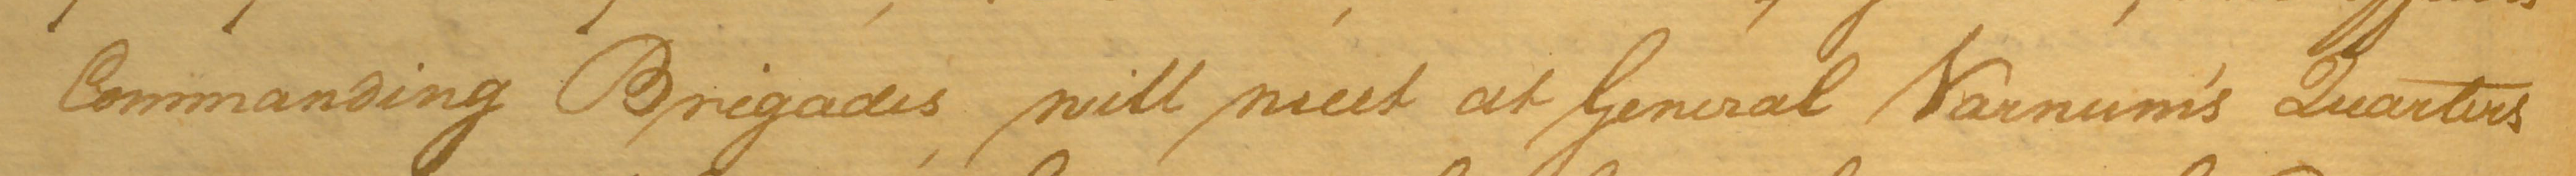Commanding Brigades will meet at General Varnum's Quarters
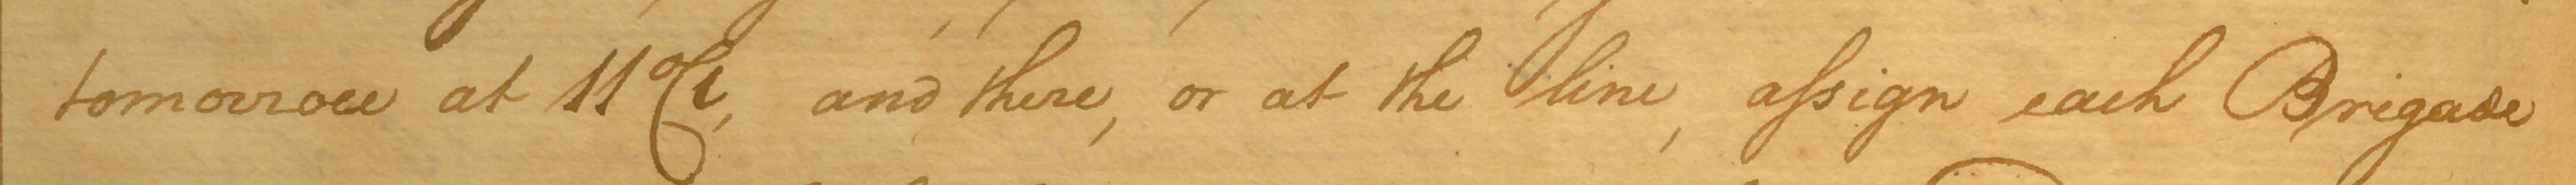tomorrow at 11 ^oCl, and there, or at the line, assign each Brigade
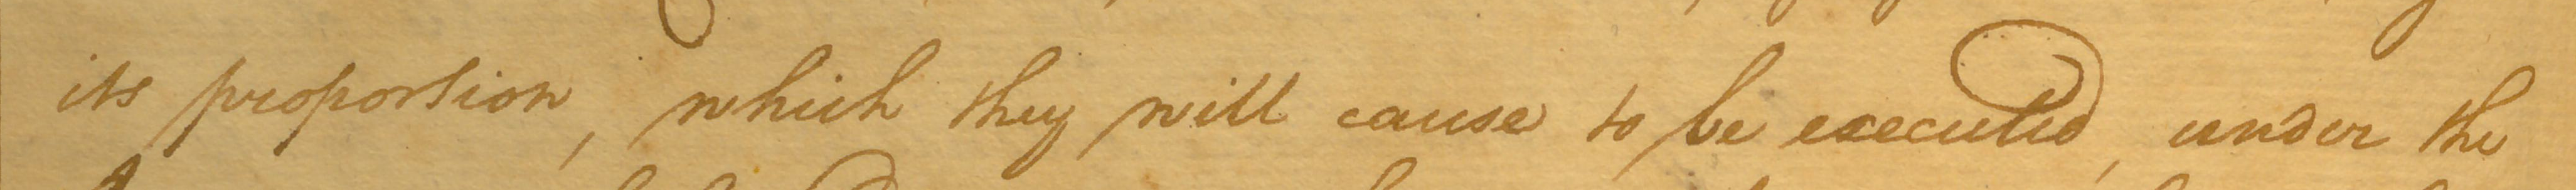its proportion, which they will cause to be executed under the
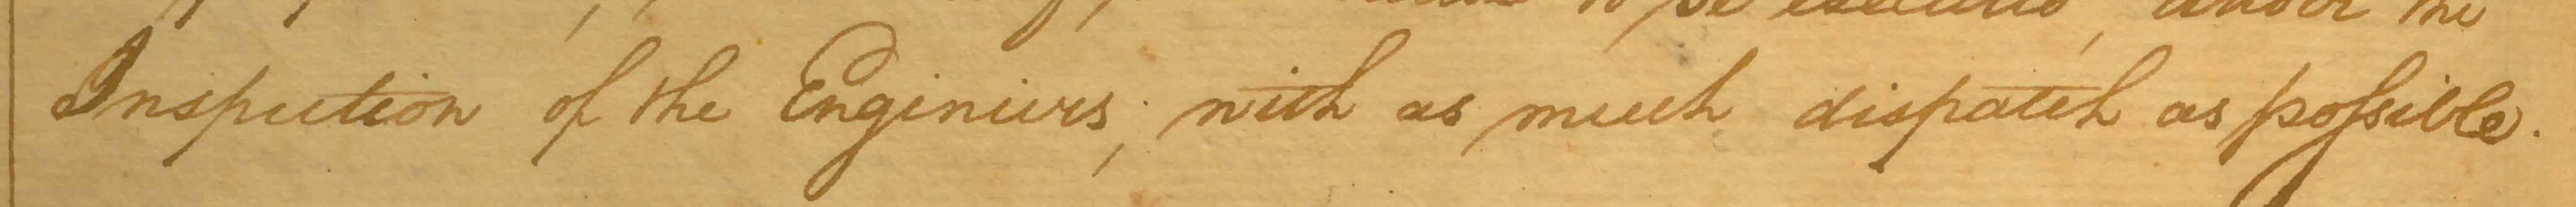Inspection of the Enginiers; with as much dispatch as possible.
